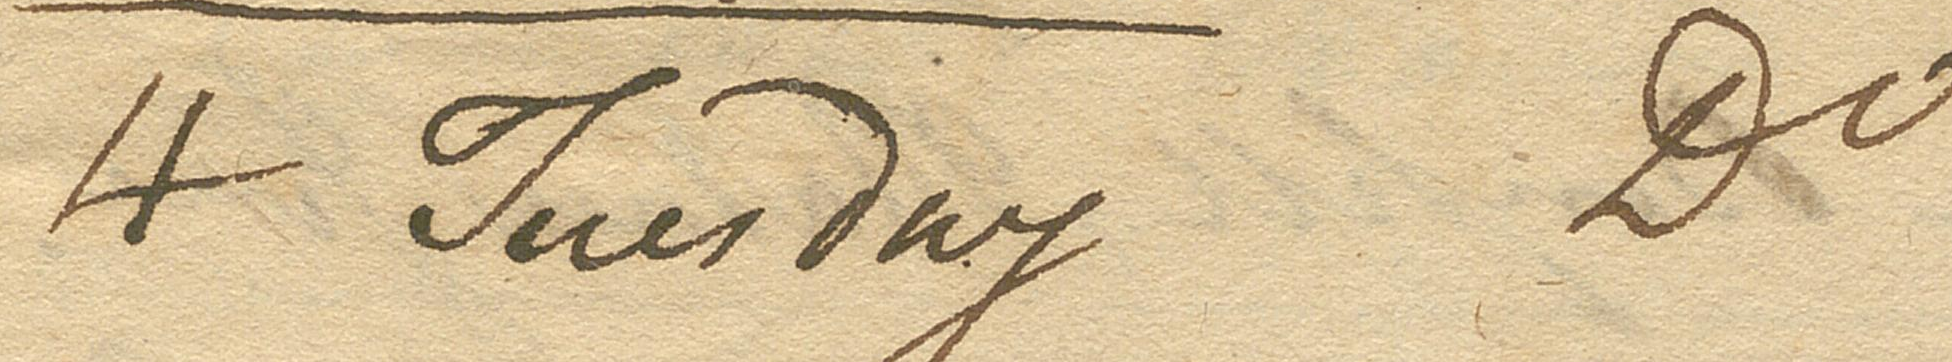4 Tuesday D^o
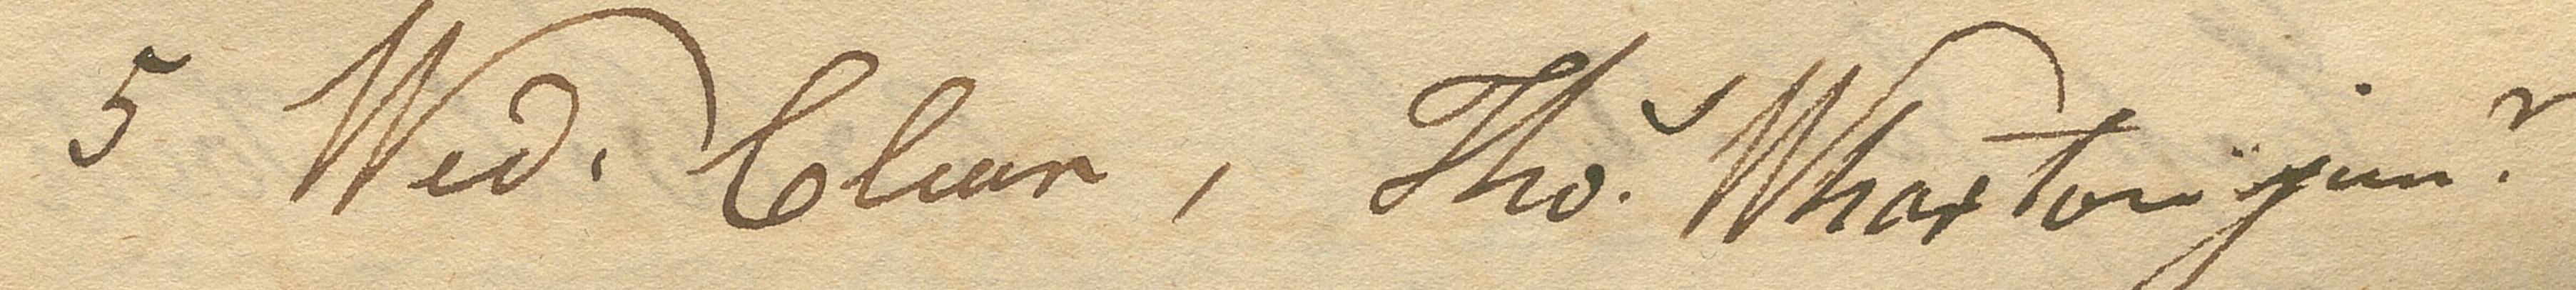5 Wed. Clear, Tho^s. Wharton jun^r.
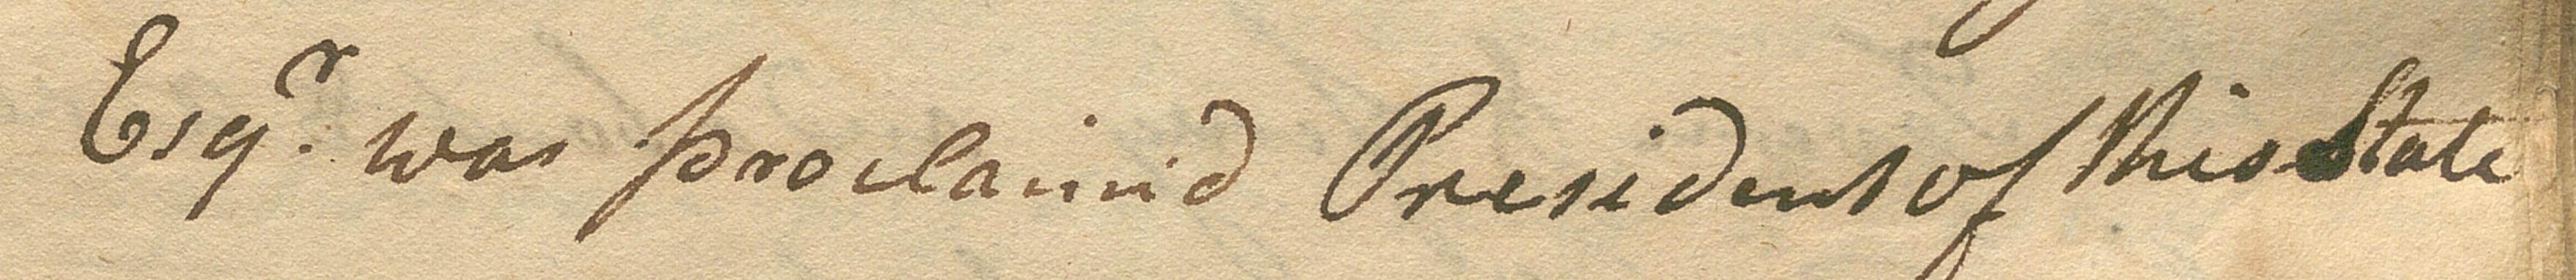Esq^r. was proclaim'd President of this State
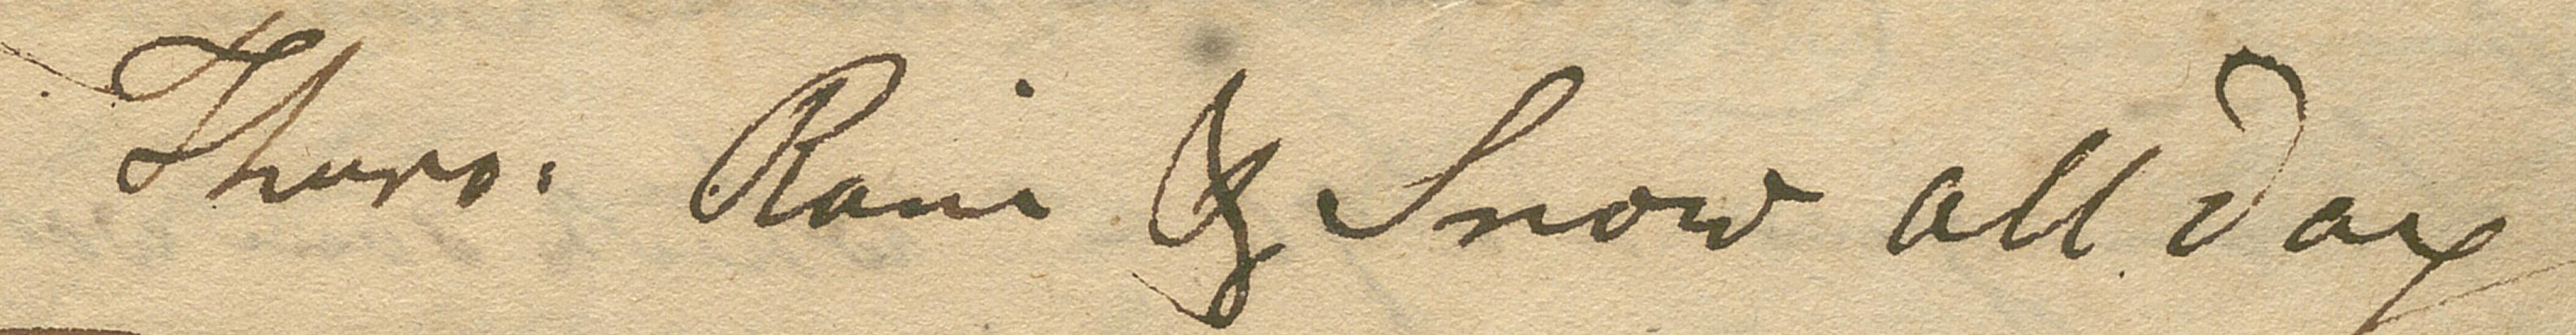Thurs. Rain & Snow all day
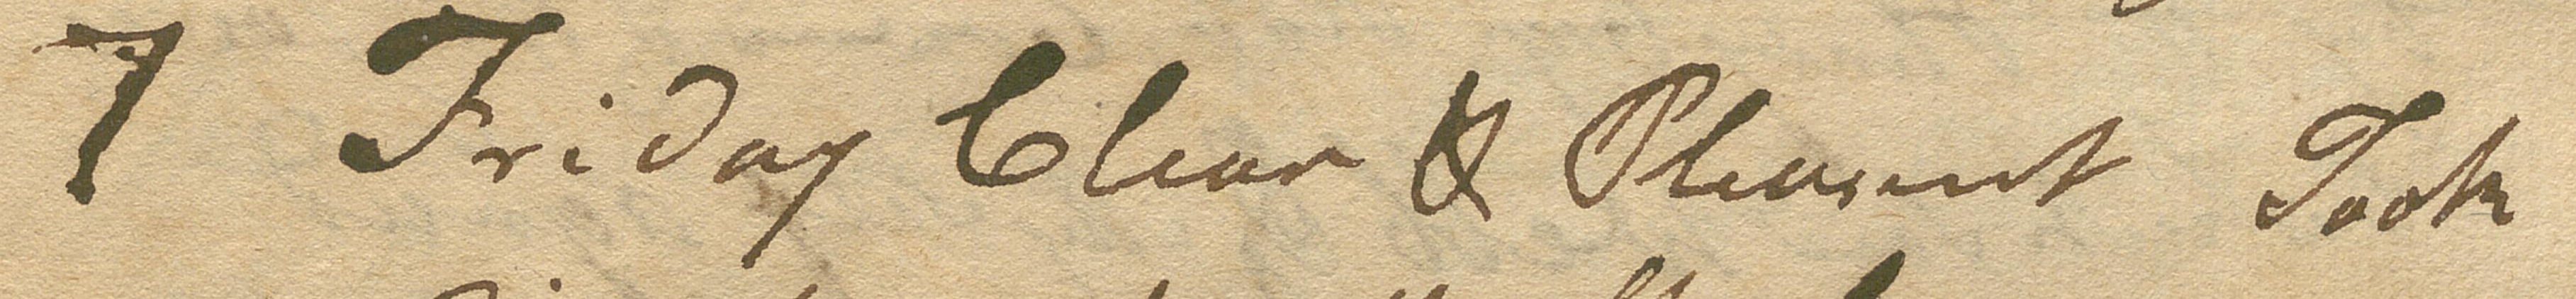7 Friday Clear & Pleasent Took
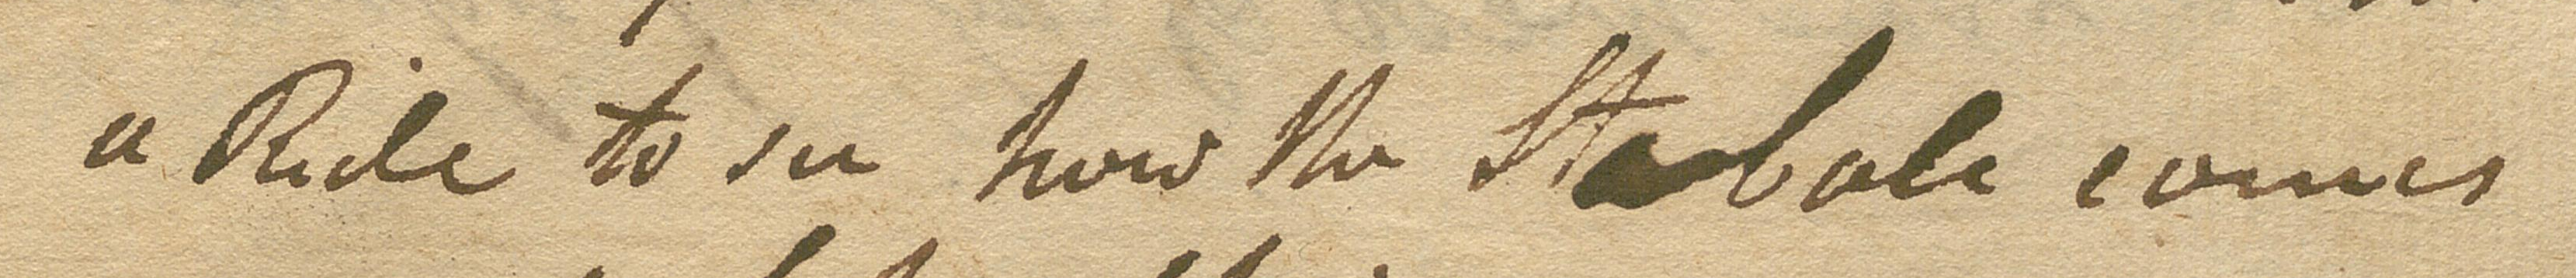a Ricle to see how the Stabale comes
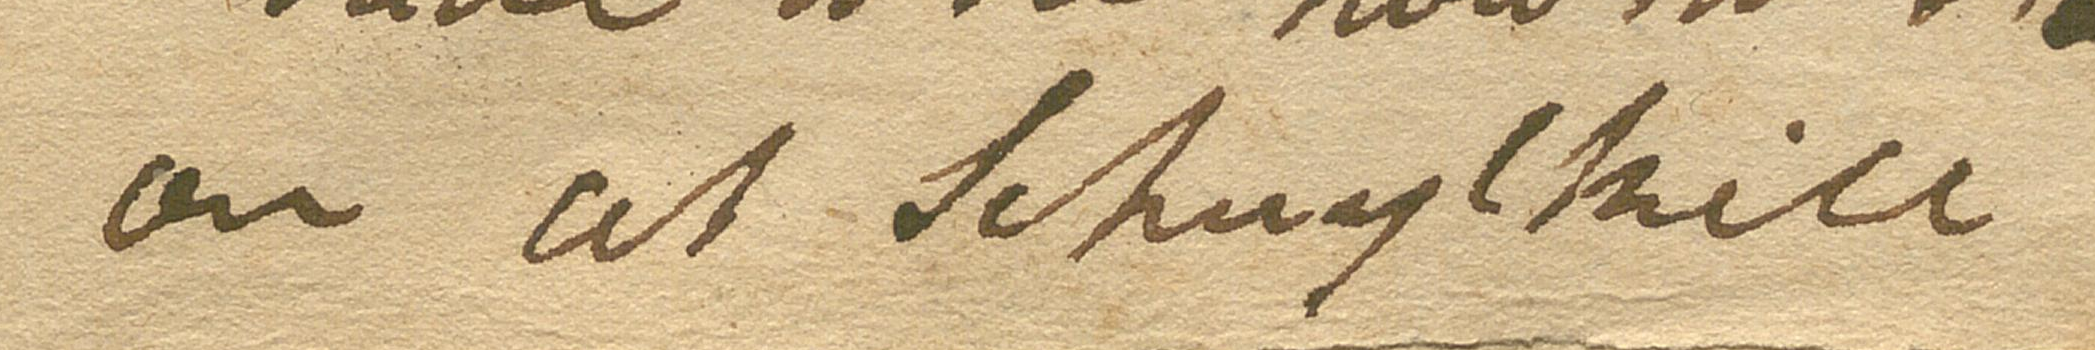on at Schuylkill
